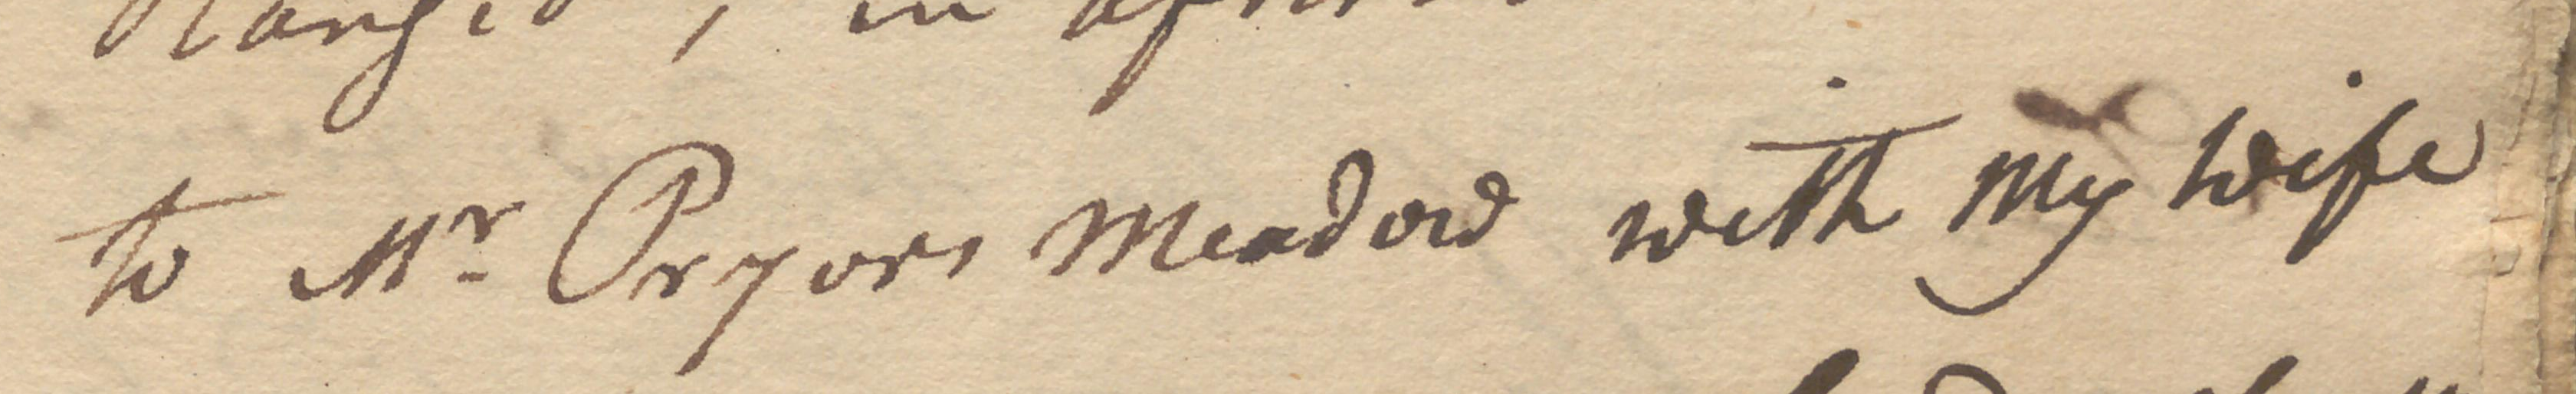to M^r. Pryors meadow with my wife
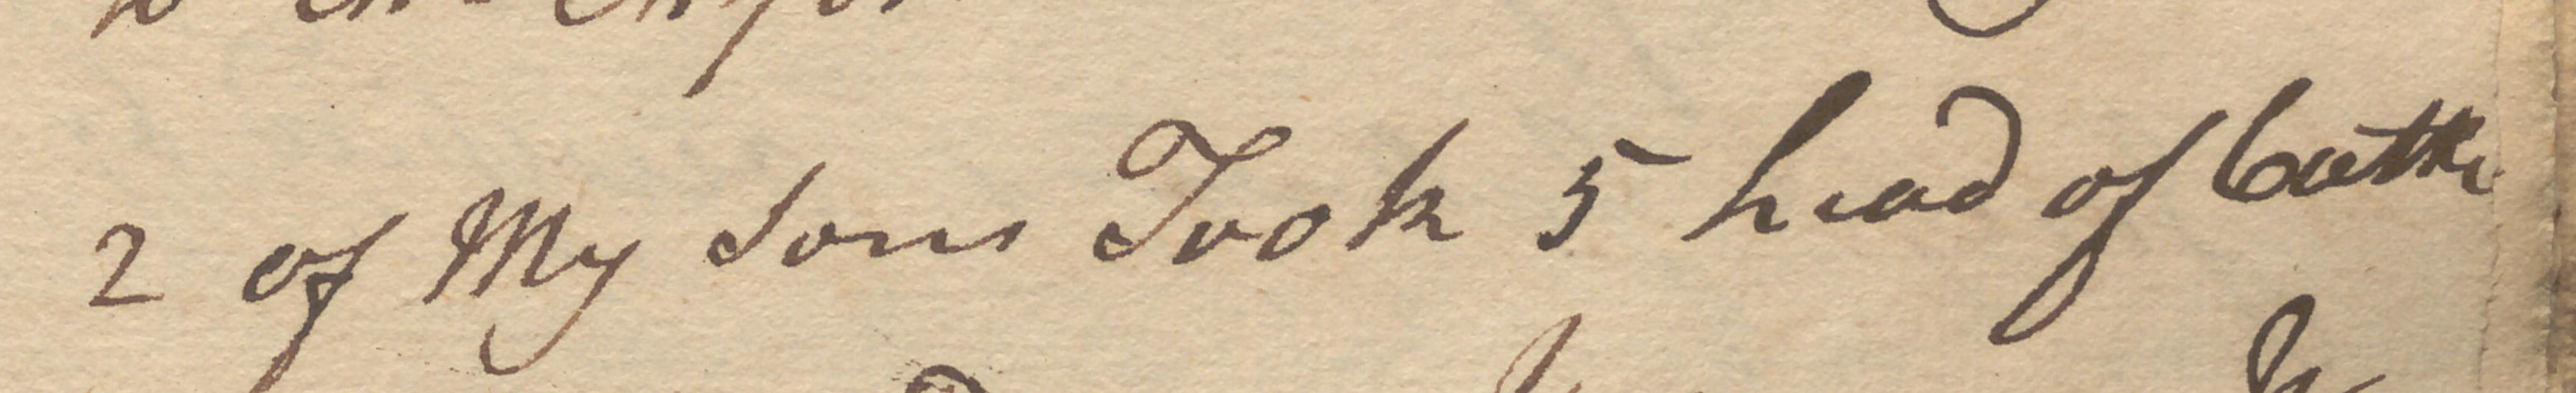2 of My sons Took 5 head of Cattle
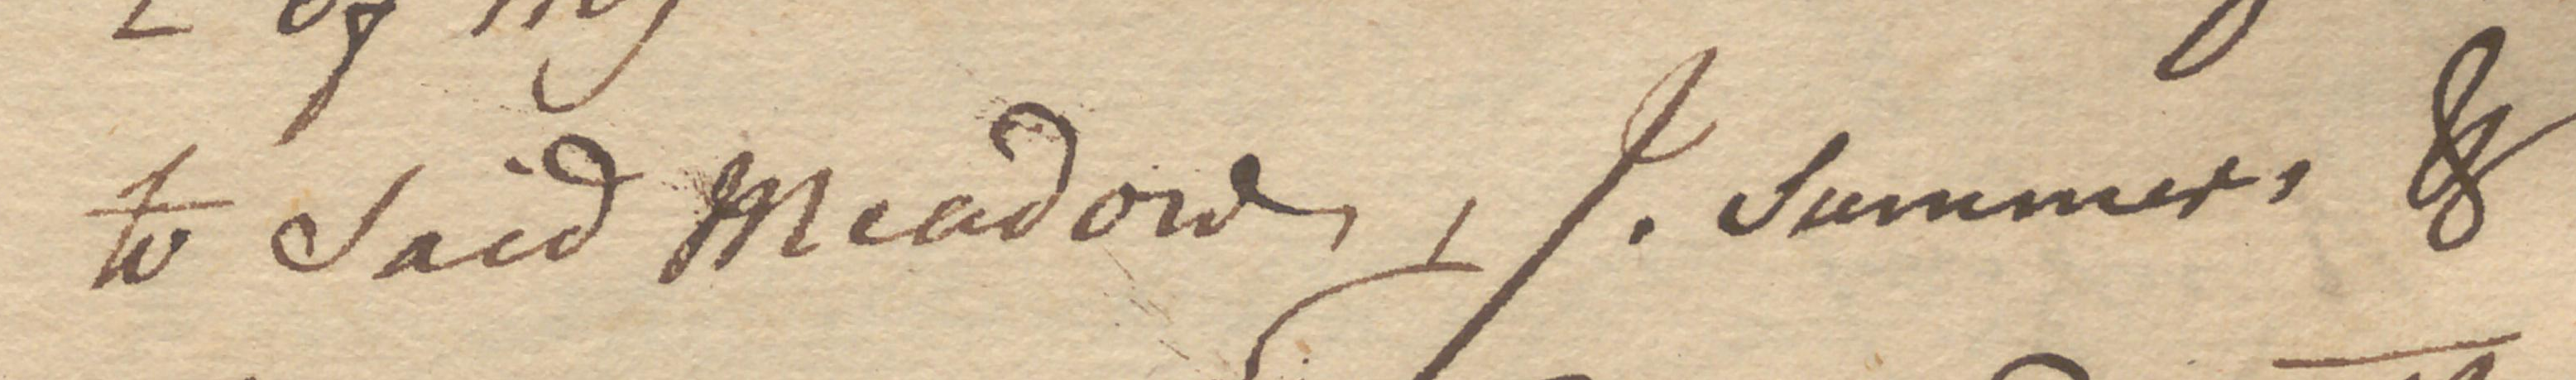to Said Meadow, J Summers &
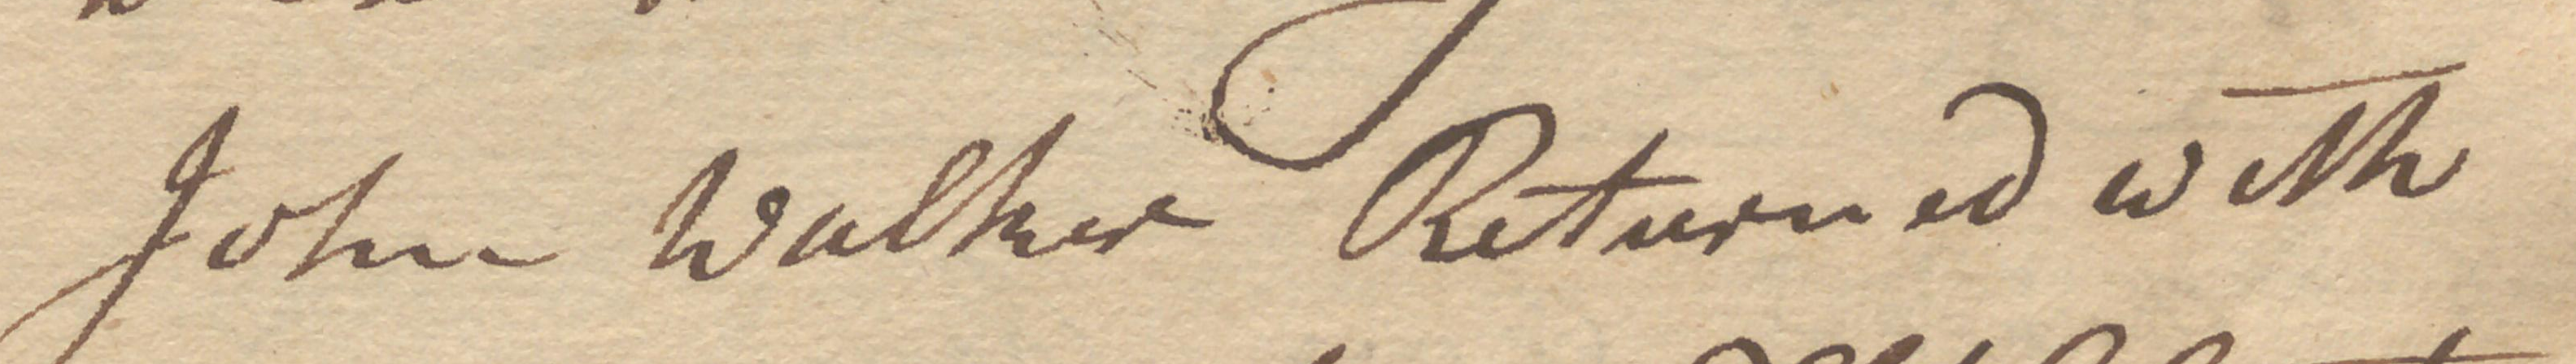John Walker Returned with
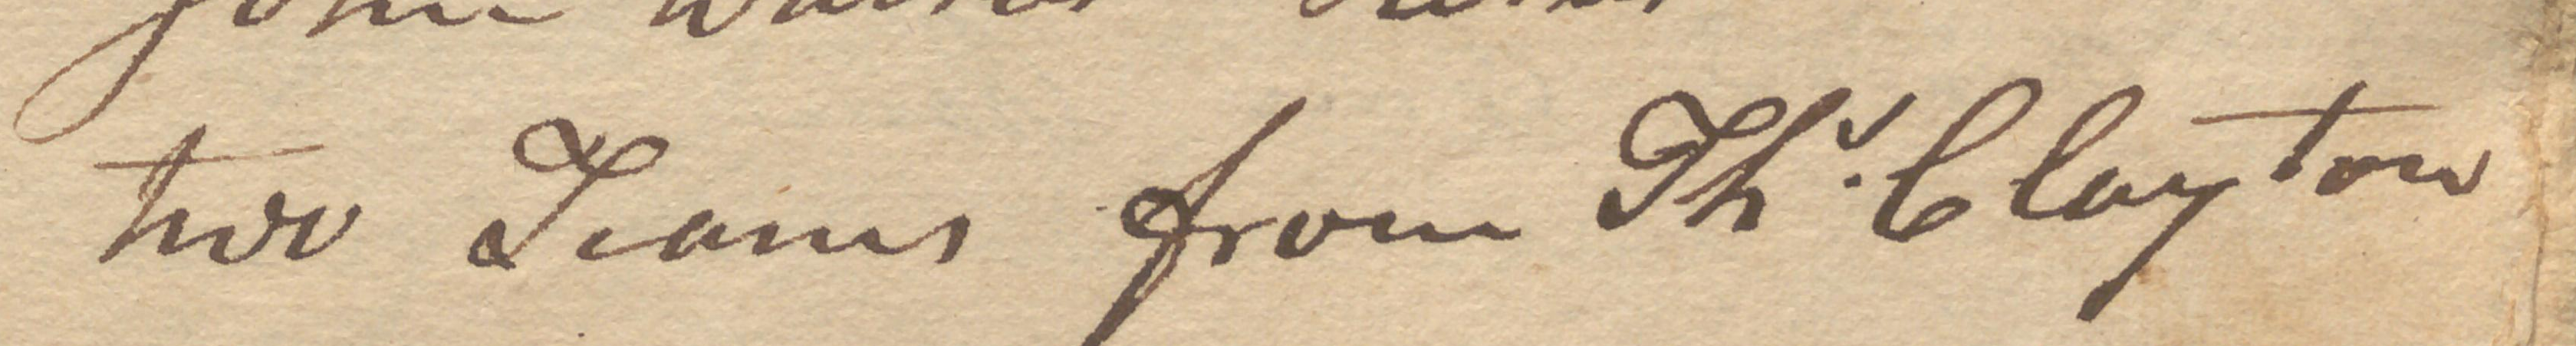two Teams from Th^s. Clayton
